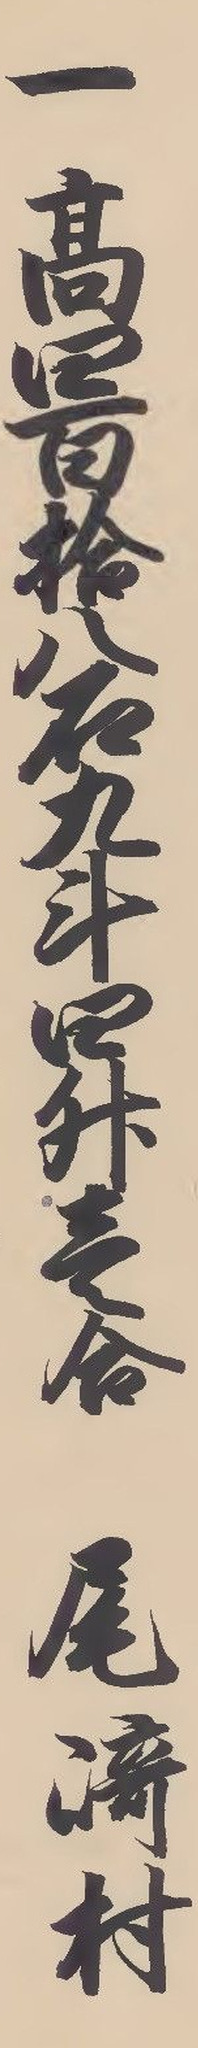一高四百拾八石九斗四升壱合尾崎村

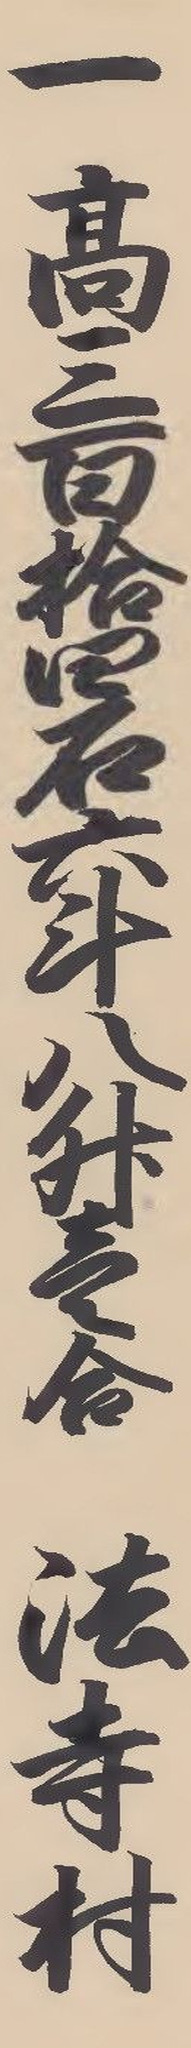一高三百拾四石六斗八升壱合法寺村
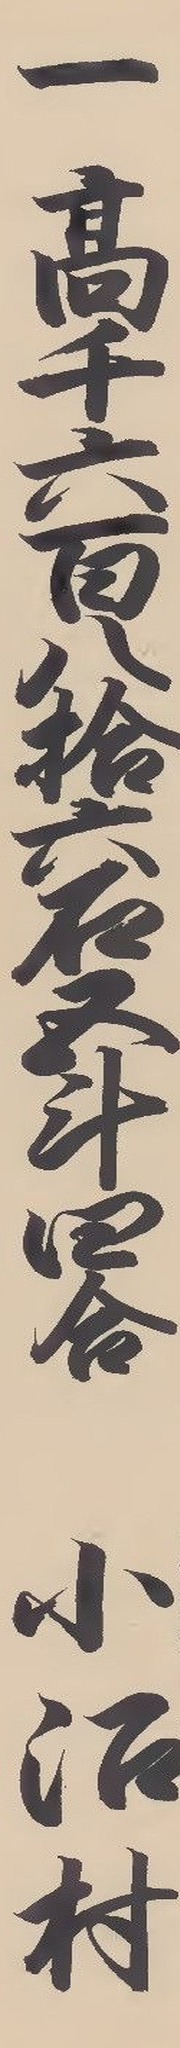一高千六百八拾六石五斗四合小沼村
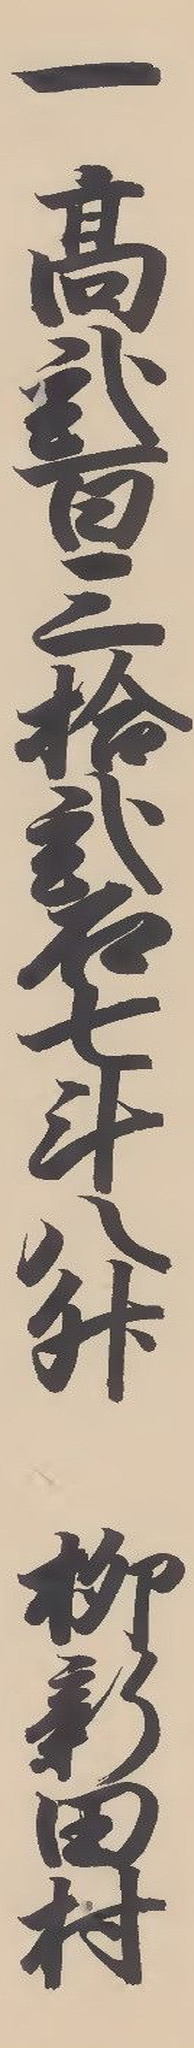一高弐百三拾弐石七斗八升柳新田村
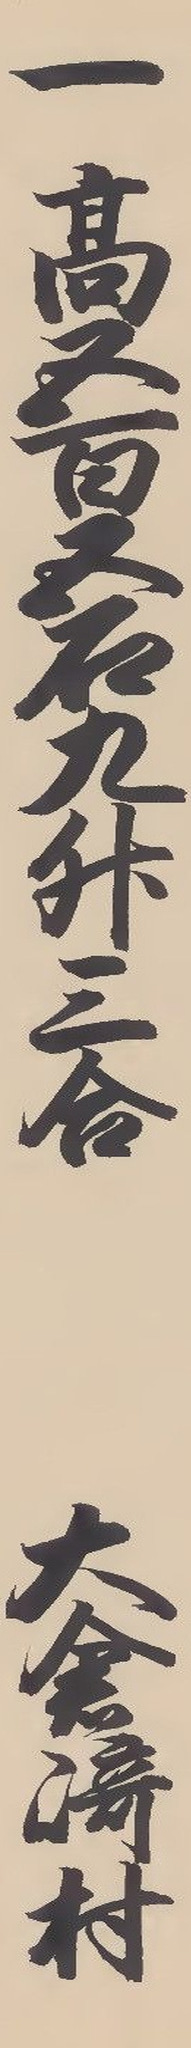一高五百五石九升三合大倉崎村
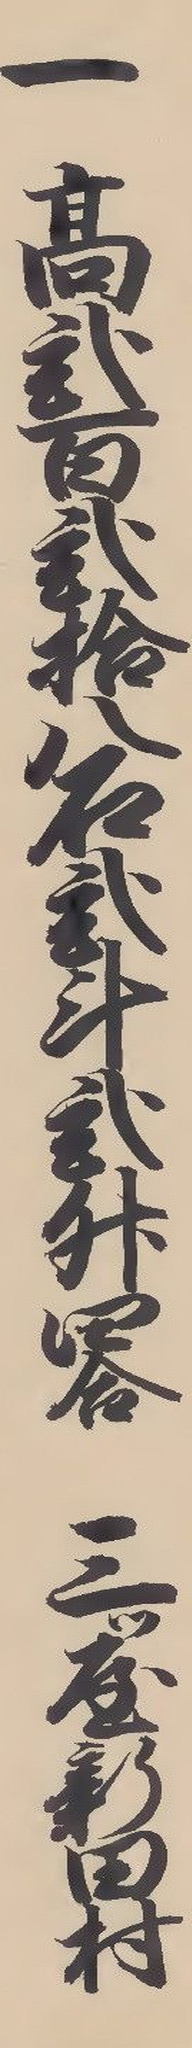一高弐百弐拾八石弐斗弐升四合三ッ屋新田村
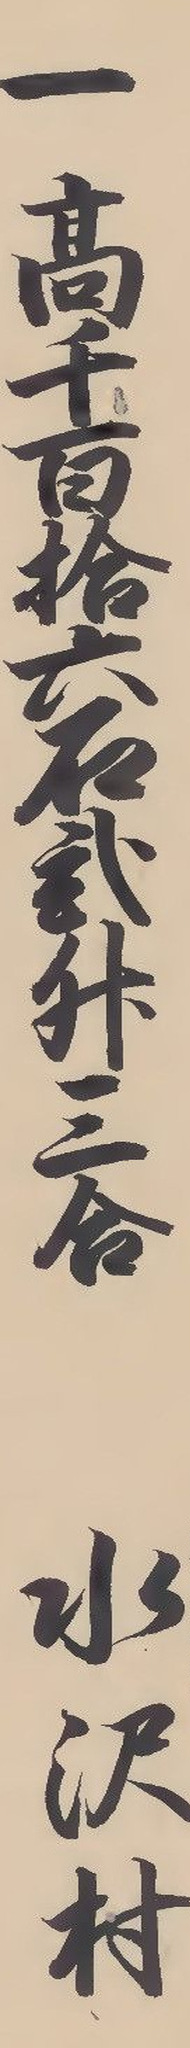一高千百拾六石弐升三合水沢村
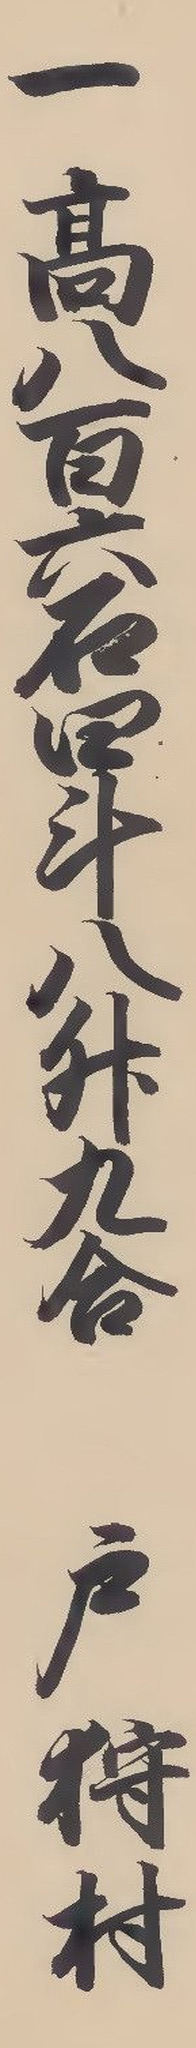一高八百六石四斗八升九合戸狩村
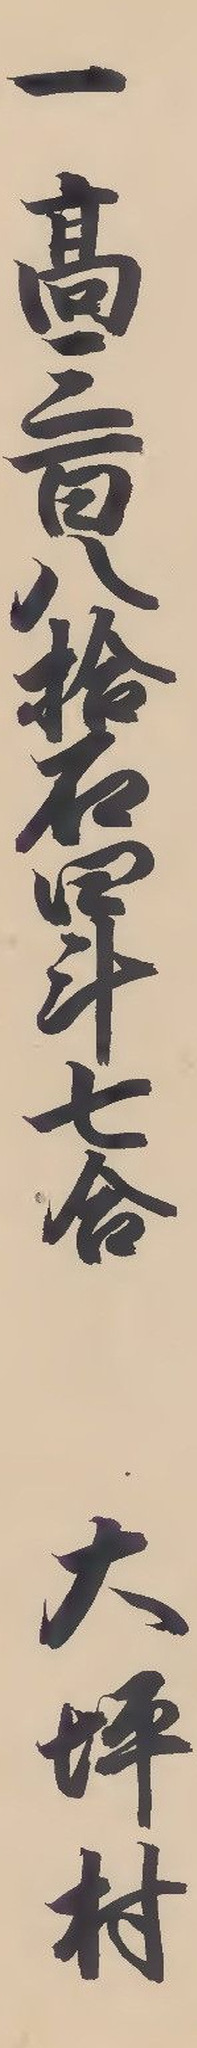一高三百八拾石四斗七合大坪村

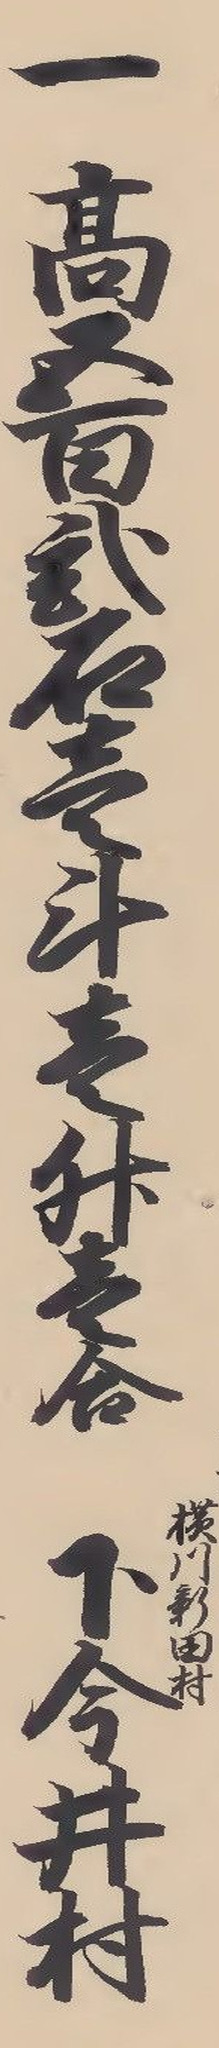一高五百弐石壱斗壱升壱合下今井村
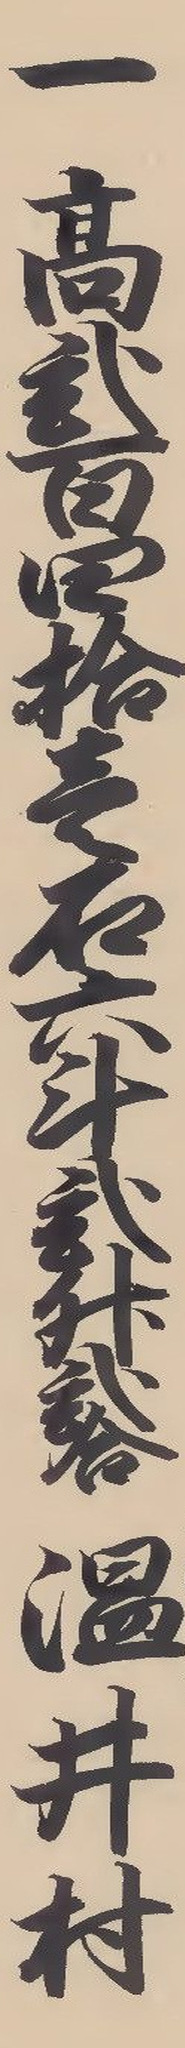一高弐百四拾壱石六斗弐升弐合温井村
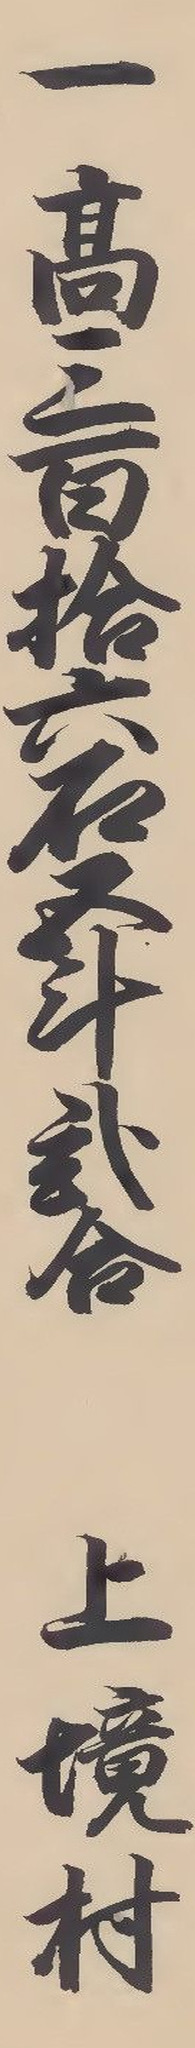一高三百拾六石五斗弐合上境村
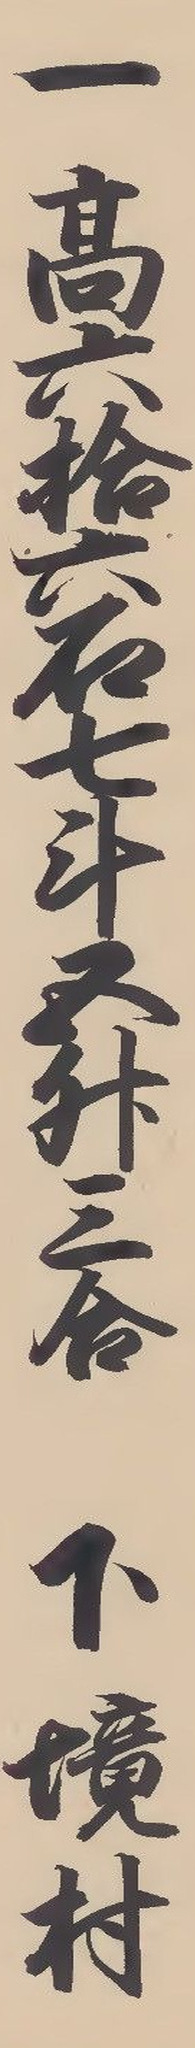一高六拾六石七斗五升三合下境村
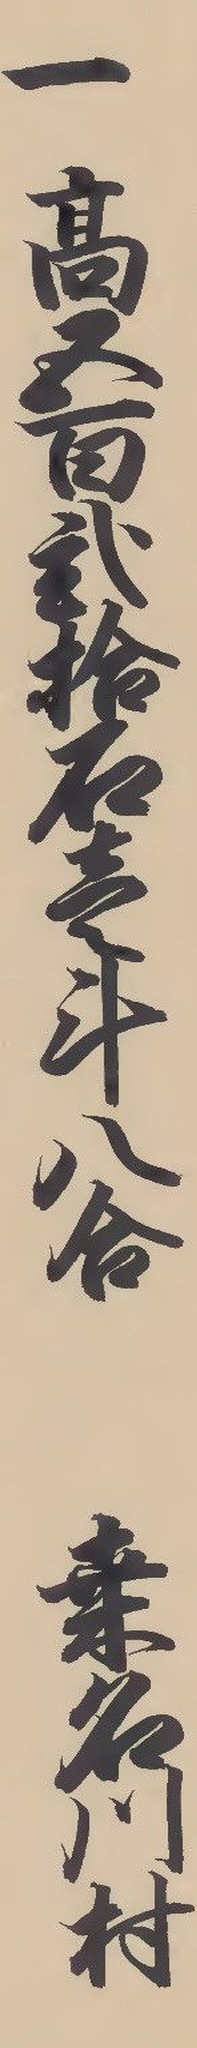一高五百弐拾石壱斗八合桑名川村
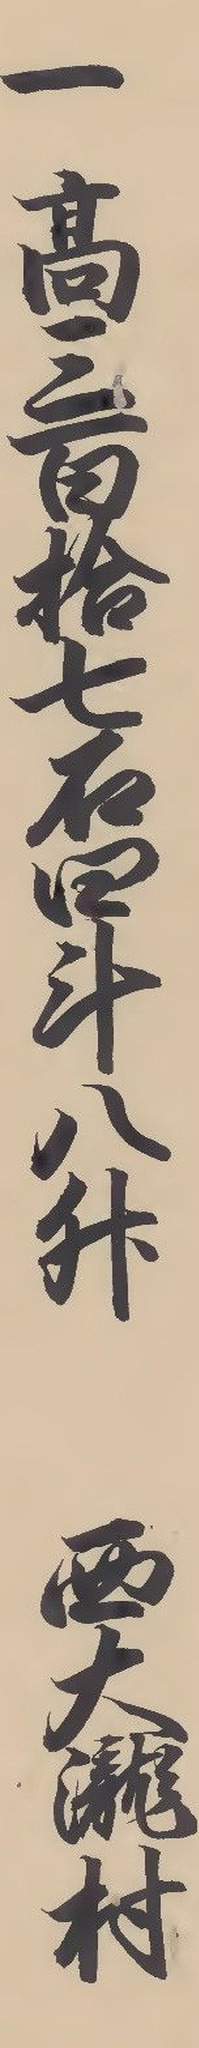一高三百拾七石四斗八升西大滝村
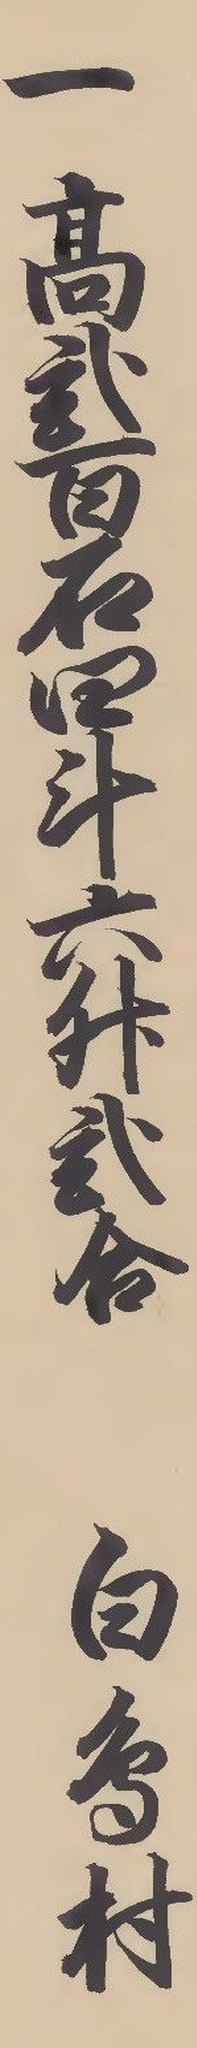一高弐百石四斗六升弐合白鳥村
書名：信濃国郷帳
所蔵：国立公文書館 National Archives of Japan
